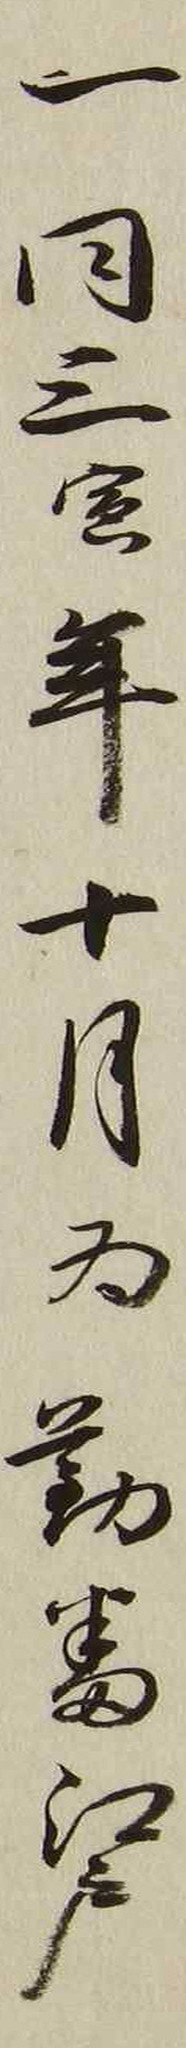一同三寅年十月勤番之為江戸
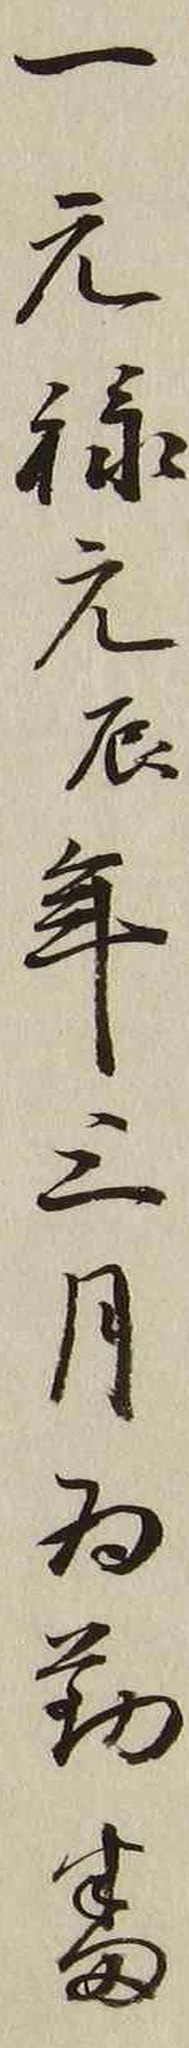一元禄元辰年三月勤番
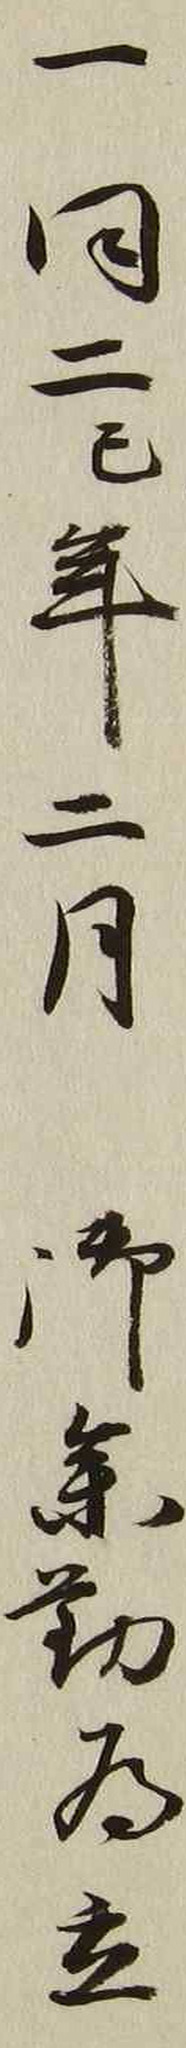一同二巳年二月御参勤立
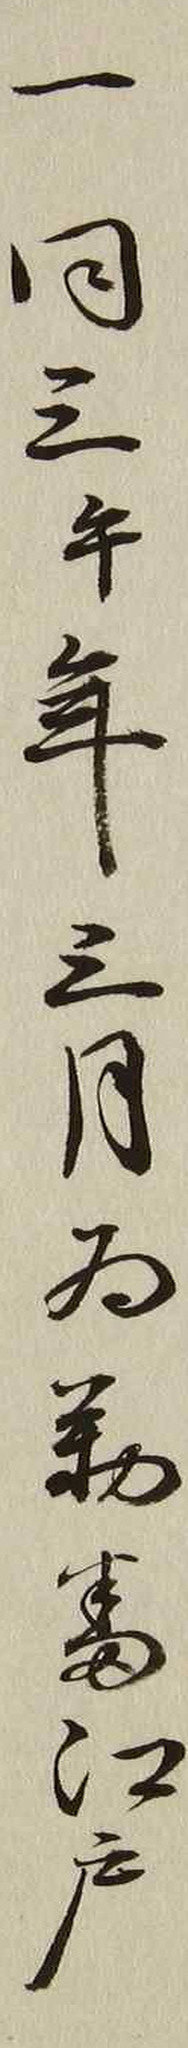一同三午年三月勤番之為江戸
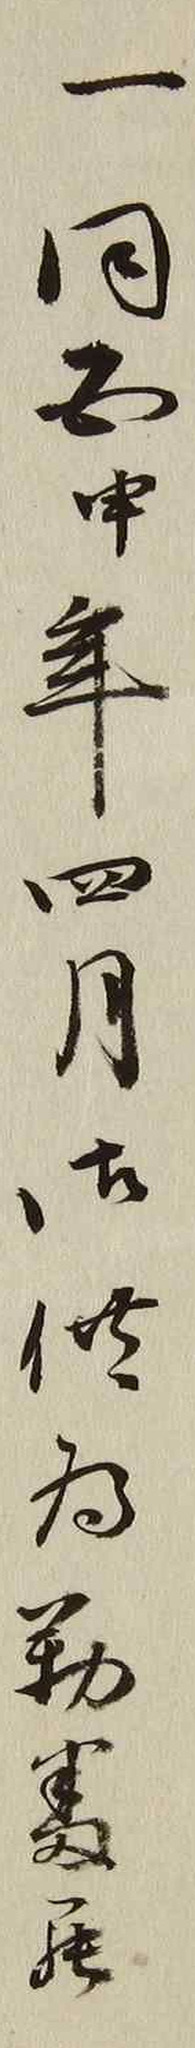一同五申年四月御供勤番之為罷り
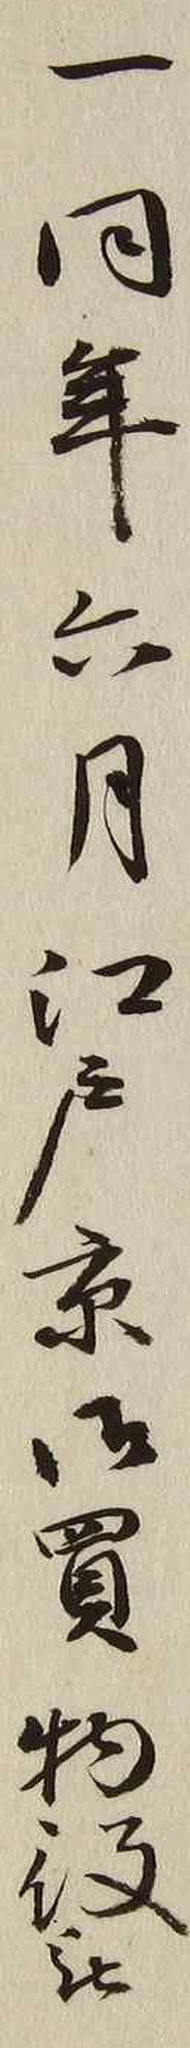一同年六月江戸京御買物役
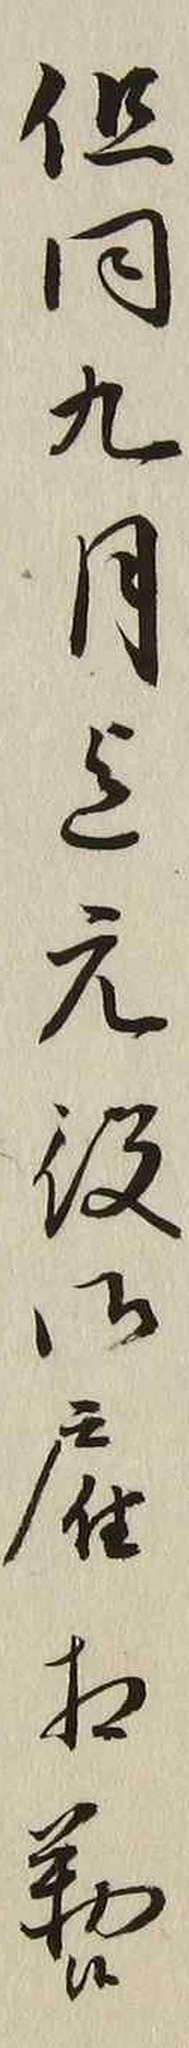但し九月迄元役御雇相勤め候
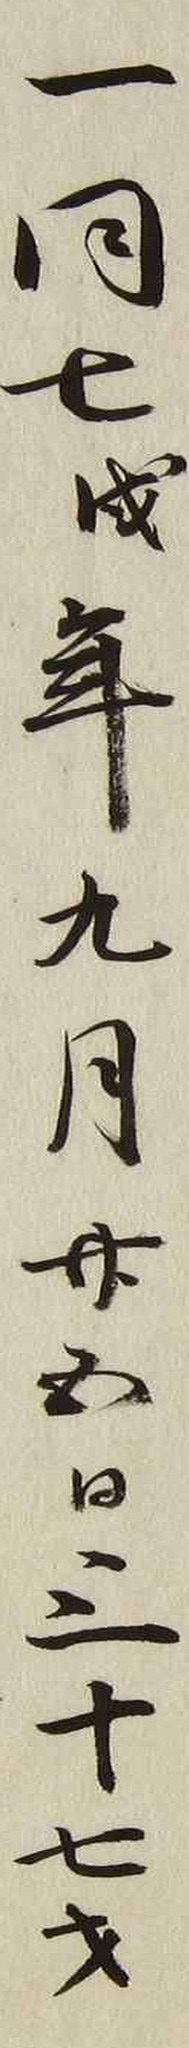一同七戌年九月廿五日三十七才
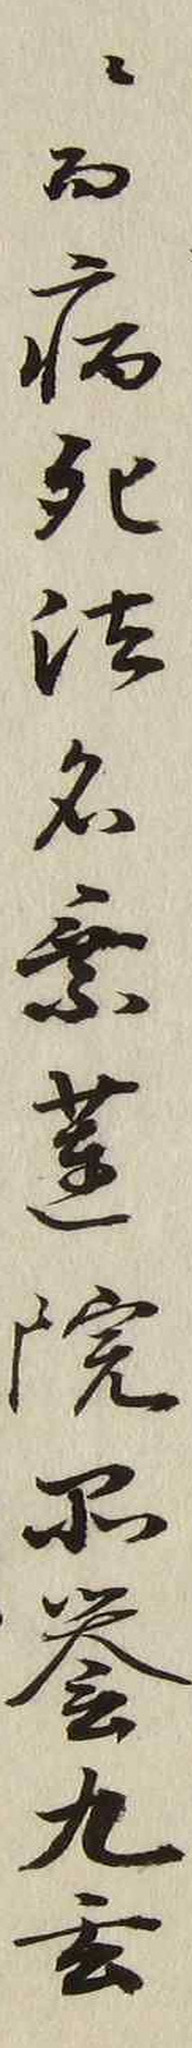二て病死法乗蓮院品誉九玄
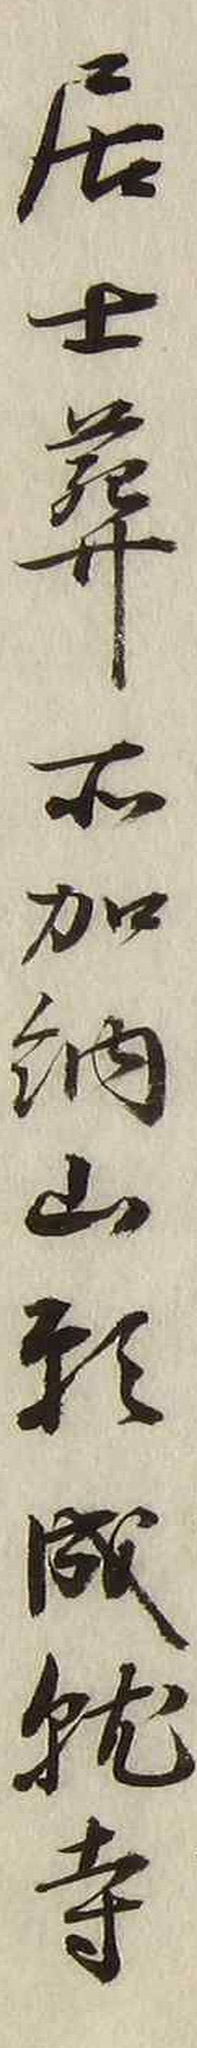居士葬所加納山願成就寺

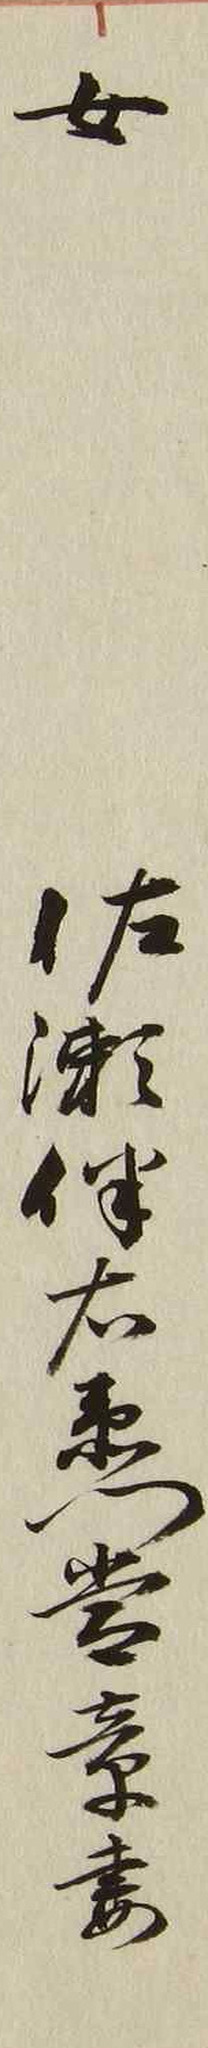女佐瀬伴右衛門営章妻
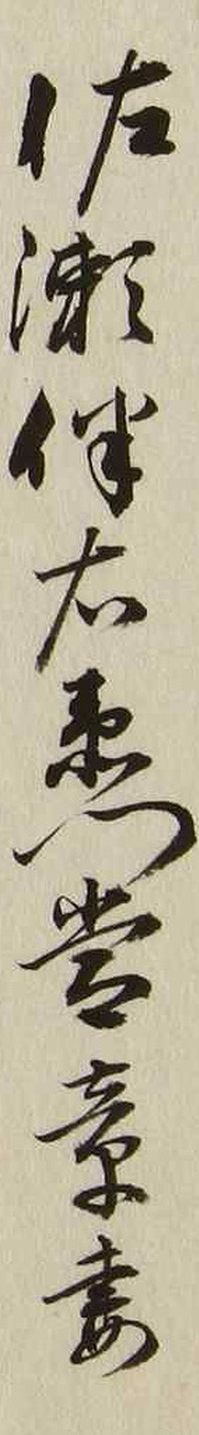女佐瀬伴右衛門営章妻
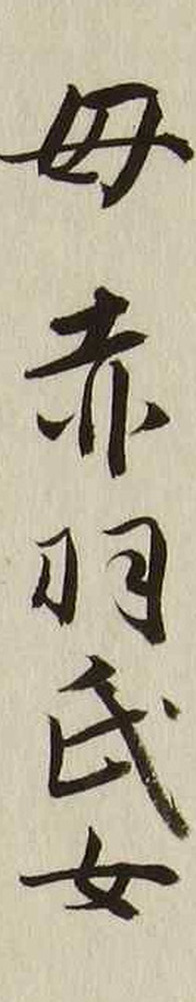母赤羽氏女
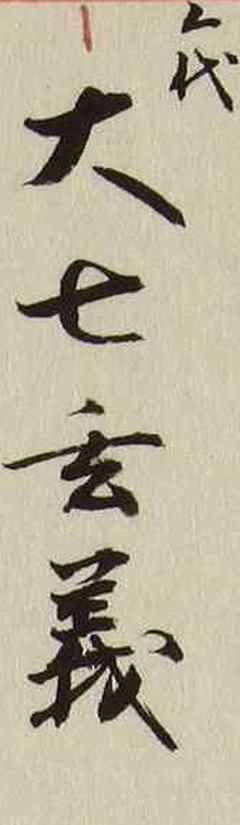大七玄義
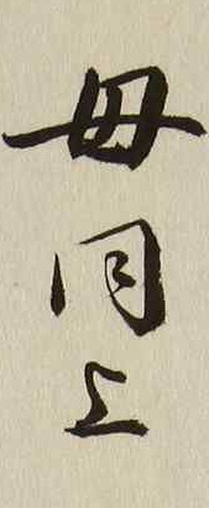母同上
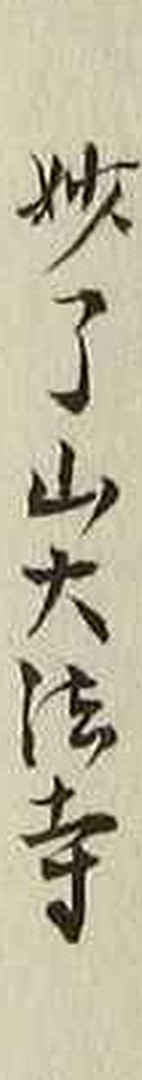妙了山大法寺
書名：諸士系譜　巻之19　い之部19
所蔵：会津若松市立会津図書館
